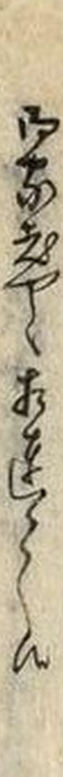御家老中へ相達之候

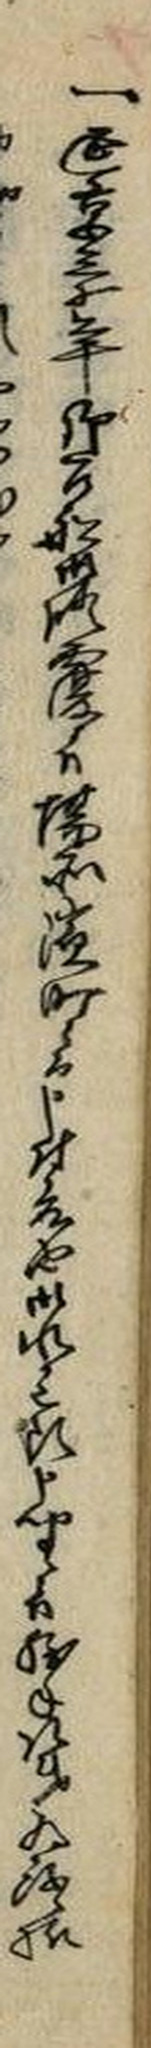一延享三刁年御召船御修覆に付場所浜町にて申付度由御水主頭申聞候に付勝手次第為致候様
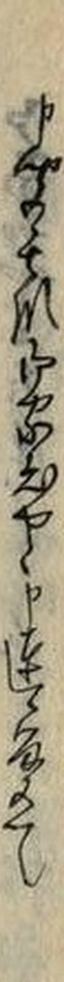申聞其段御家老中へ申達候留有之
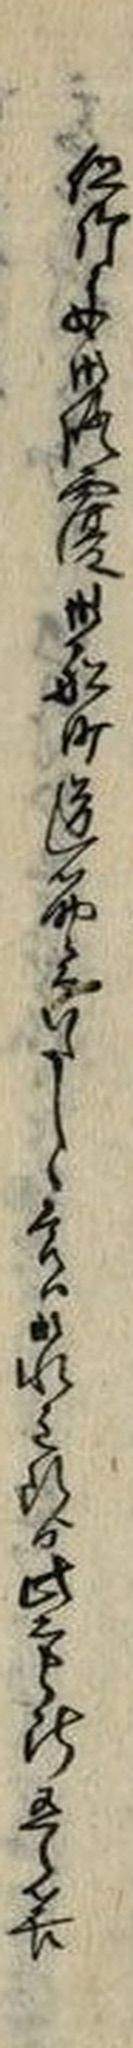但御舟御修覆御船町道筋にていたし候節は御水主頭ゟ此方へ断有之筈
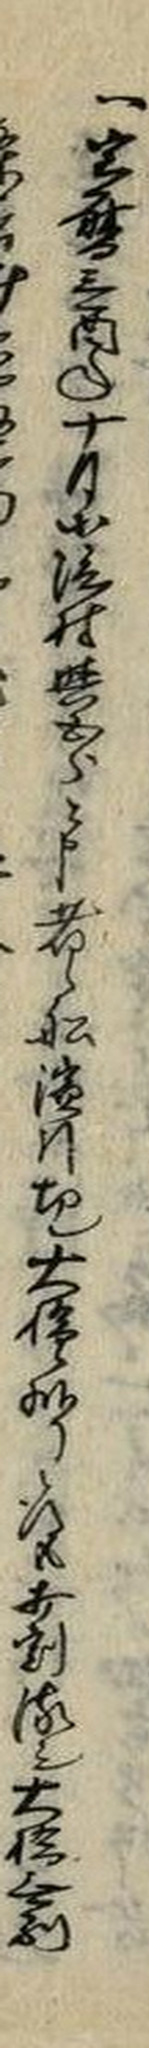一宝暦三酉年十月小渡村与五郎と申者之船浜引切レ大橋へ掛り候得共打割流シ大橋無別
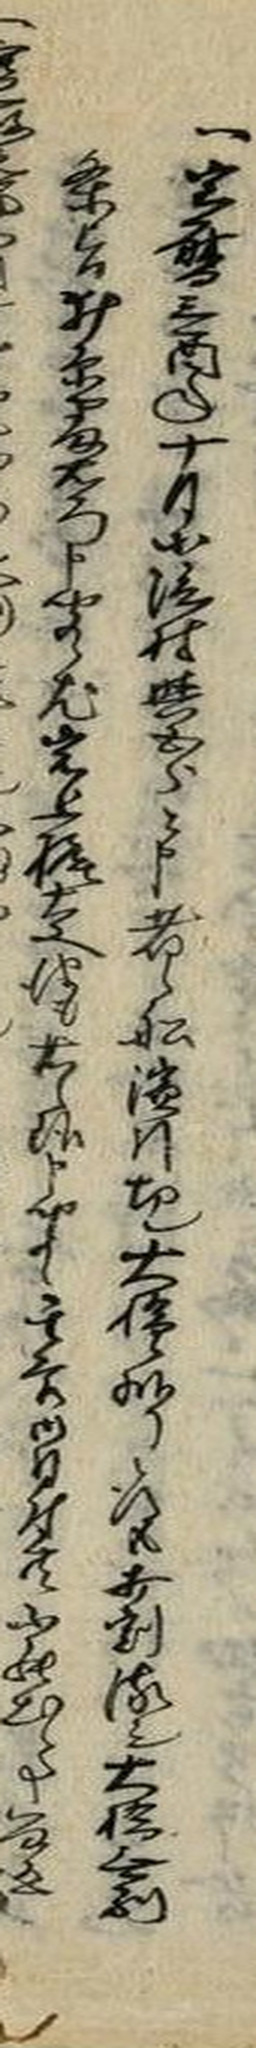条旨井原番右衛門申聞候尤岩上梶大夫儀も右之趣申聞候其節御目付共不罷出候事留有之
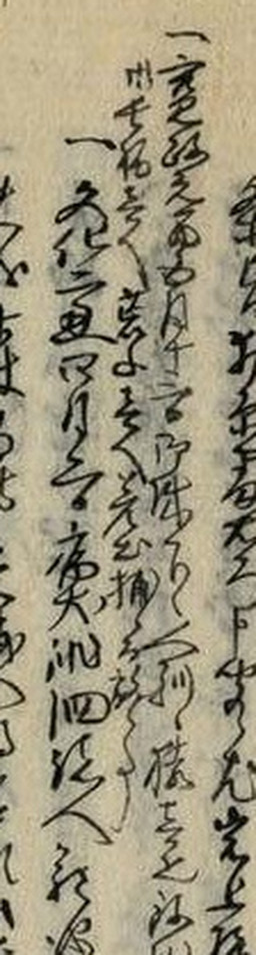御長柄壱人荒子壱人差出捕候て放候事
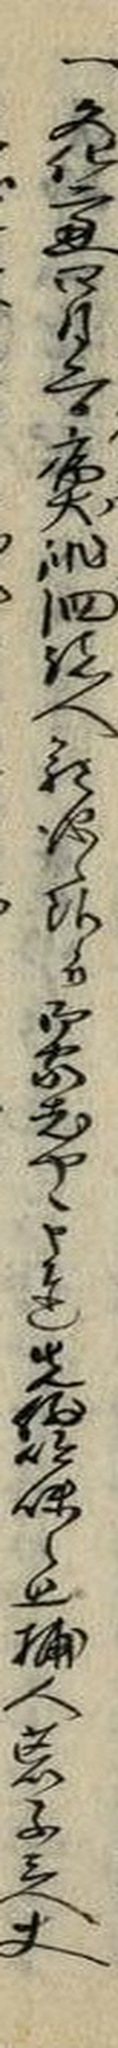一文化二丑四月二日病犬徘徊諸人難儀之趣に付御家老中へ申達先例吟味之上捕人荒子三人丈
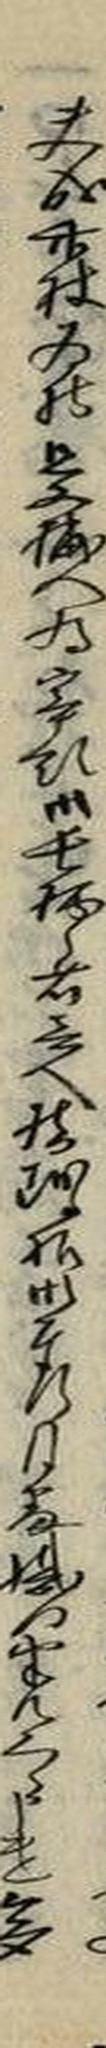夫成竹杖為持且又捕人為宰領御長柄之者壱人指越候様御奉行月番織田半左衛門へ申遣今夕
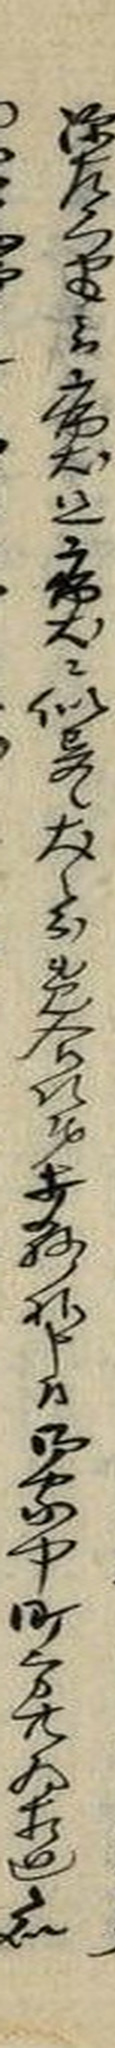源左衛門宅にて病犬且病犬に似寄候犬之分も見合次第打殺候様申付御家中町方共為相廻候処
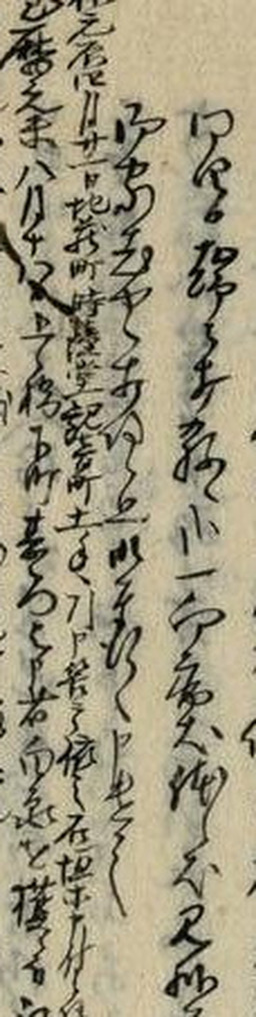御家老中へ相伺候上御奉行へ申遣之
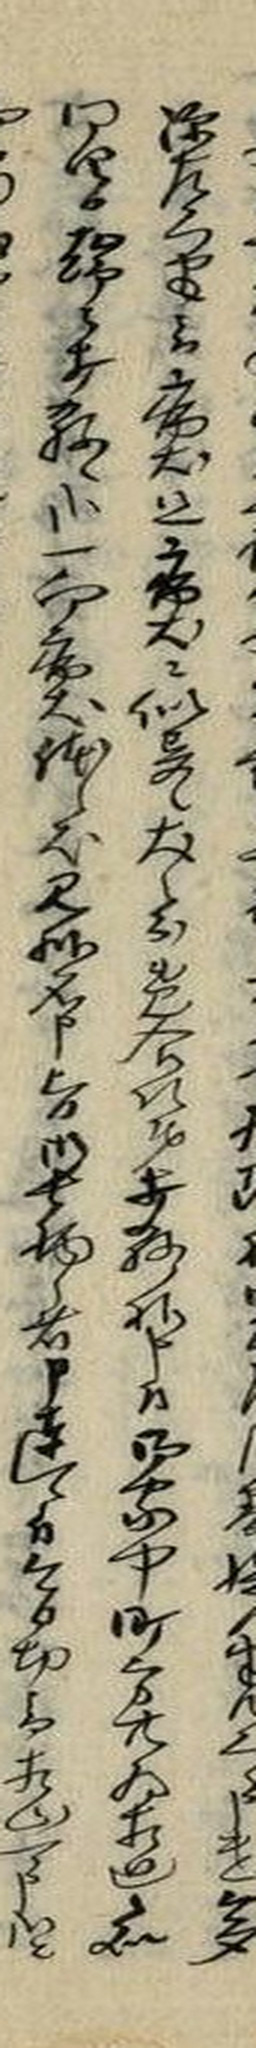同四日端々打殺候哉一向病犬体之犬見掛不申旨御長柄之者申達候に付今日切にて相止可申哉と
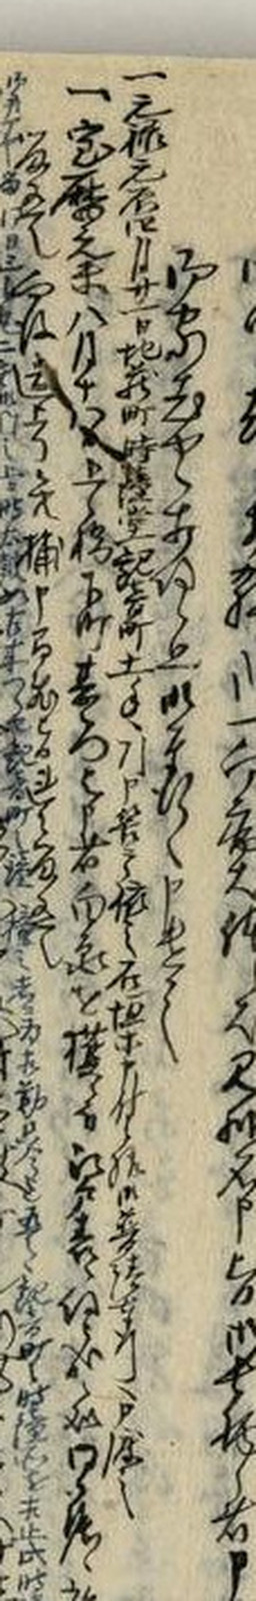一元禄元辰四月廿一日地蔵町時鐘堂観音町土手へ引申筈に候依之石垣等申付候様御普請奉行へ申渡之
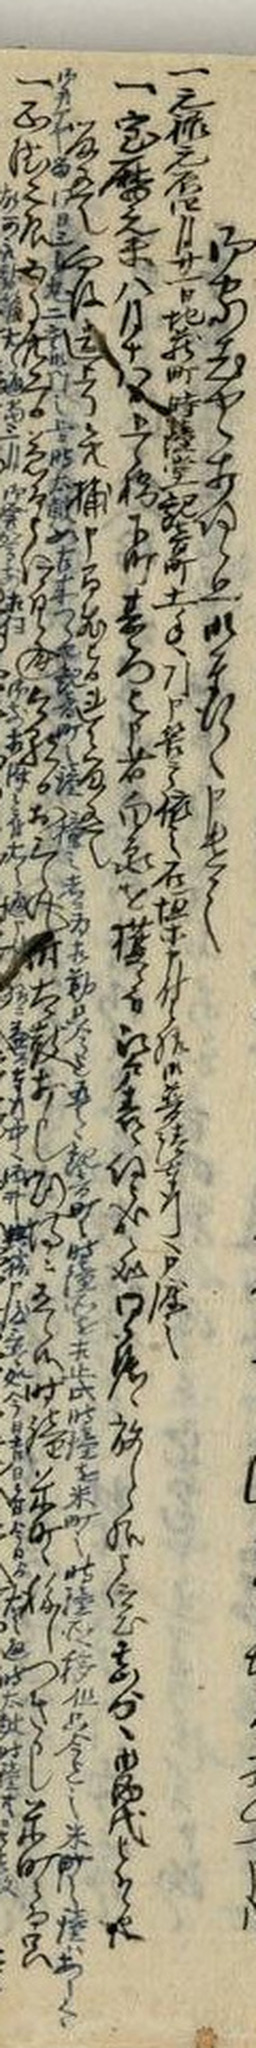一宝暦元未八月十八日上ノ橋下町甚右衛門と申者白亀を獲候に付江戸表へ伺被成候処同御堀へ放し候様被仰出甚右衛門へ御酒代被下候儀
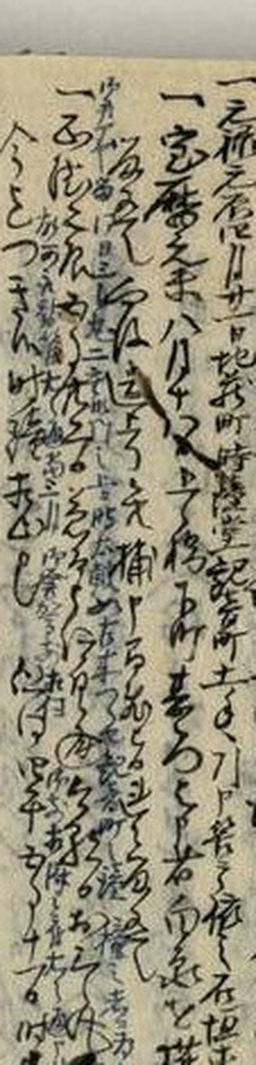留有之向後這上り候共捕申間敷旨連々留有之
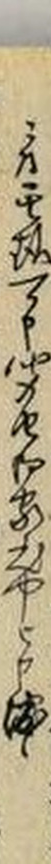に付其趣可申聞由御家老中被申渡候
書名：御城下諸事之部
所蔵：福井県文書館 Fukui Prefectural Archives
